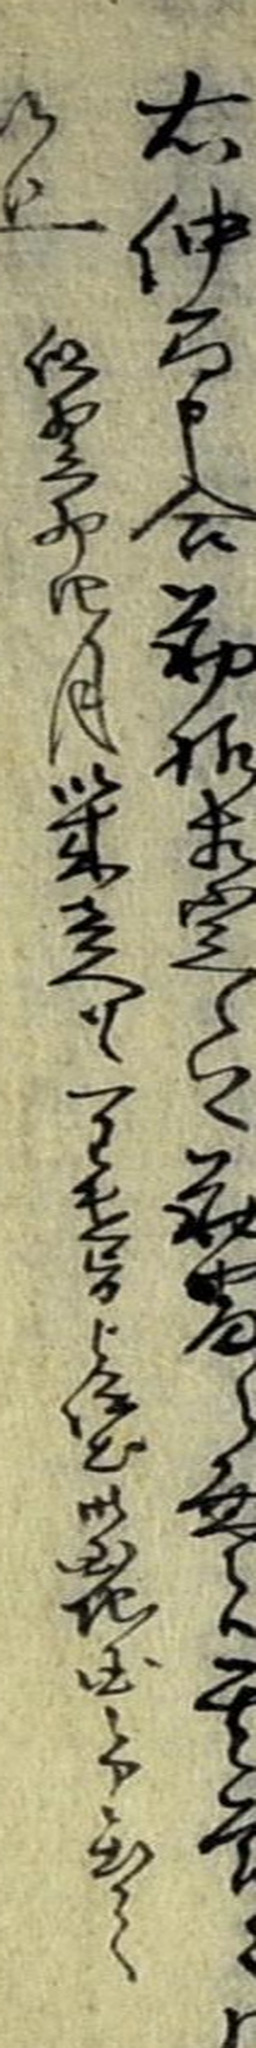以上但翌卯四月以来壱人ツヽ可被遣旨被仰出御国他国之部ニ出之
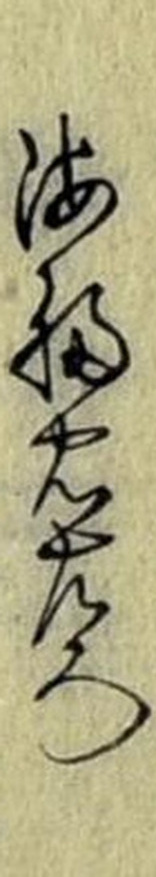海福忠左衛門
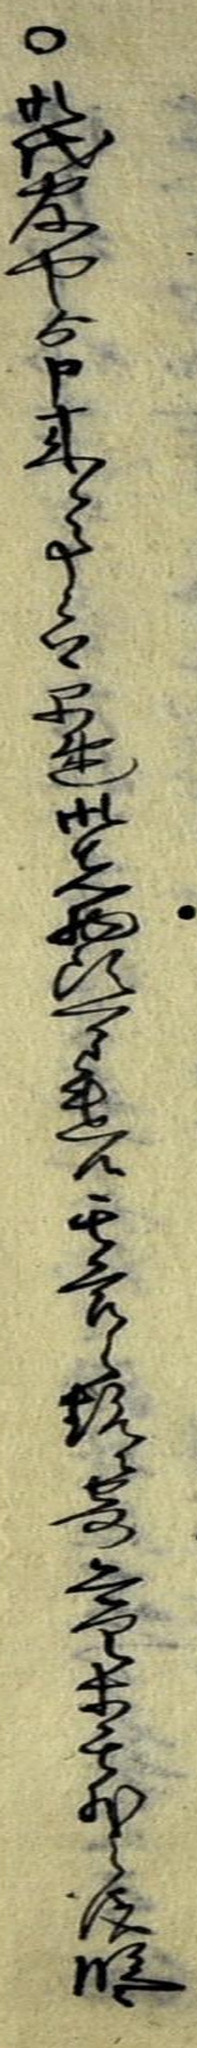〇御代官中ゟ申来候事ニ候ハヽ早速御先物頭可被遣候其節之趣ニ寄兵具等其外之儀段々

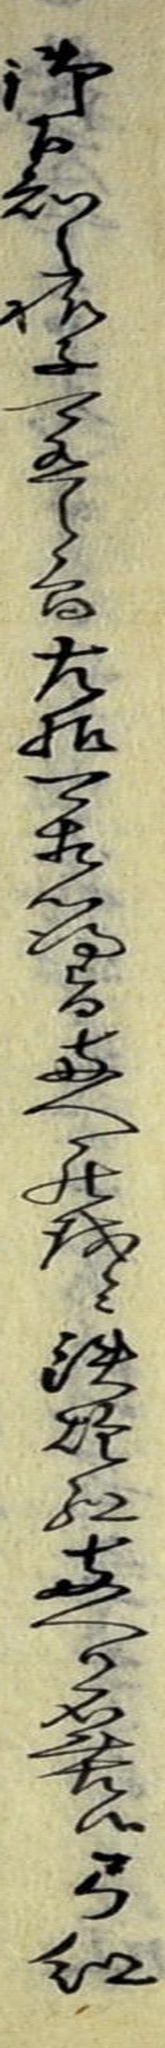御下知之様子可有之候間左様可相心得旨両人罷越候ニ鉄炮組両人ハ不苦候弓組
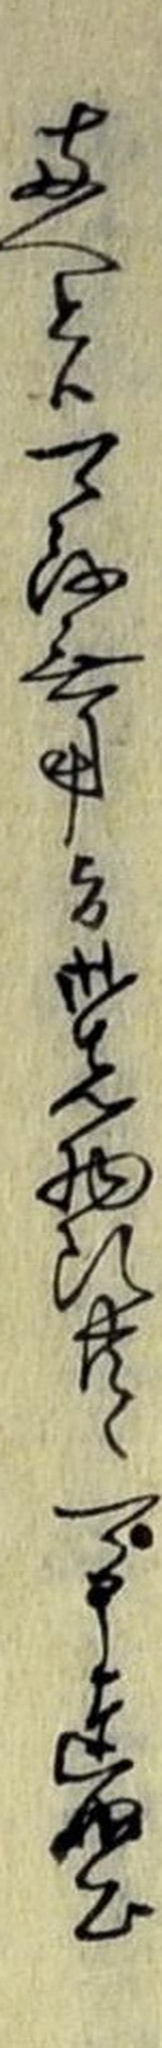両人とハ可致無用旨御先物頭共へ可申達候？以上
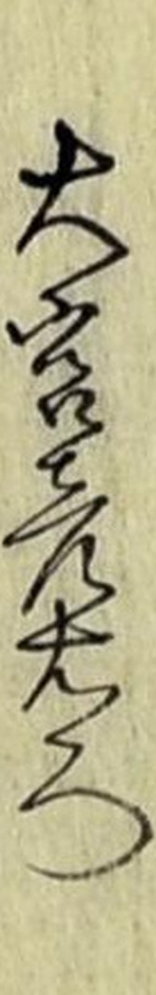大宮彦右衛門
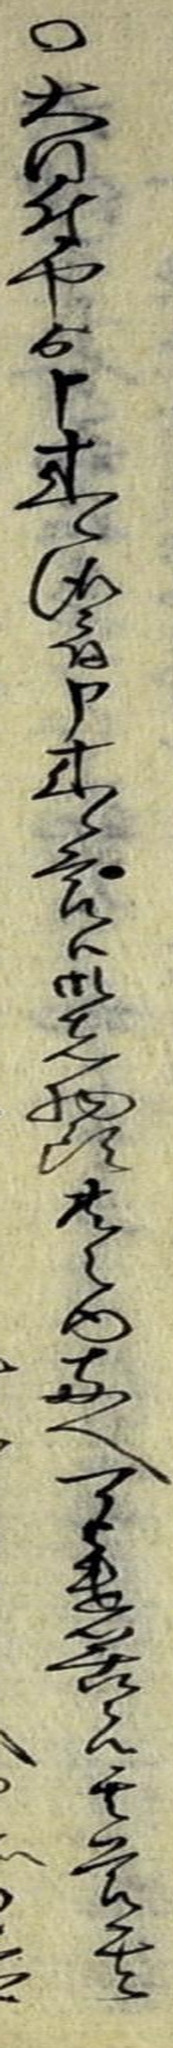〇大目付中ゟ申来候趣ニ付申来候節ハ御先物頭共之内両人可被遣筈ニ候其節其
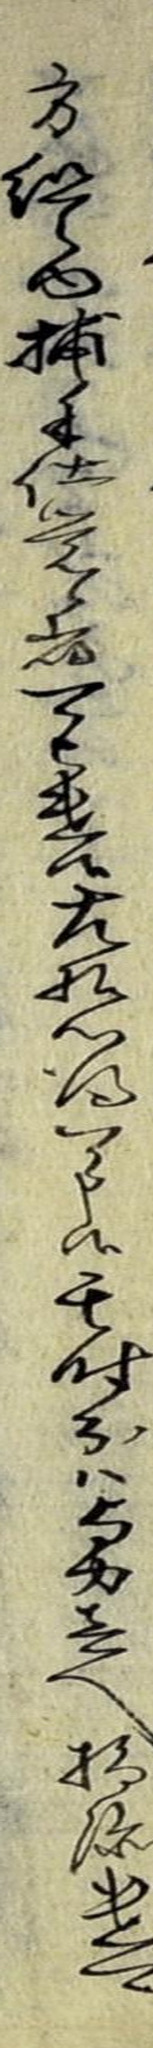方組之内捕手仕覚候者可被遣候左様心得可申候其時分ハ与力壱人指添遣可
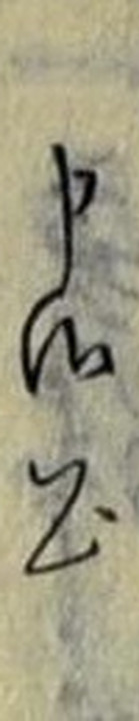申候以上
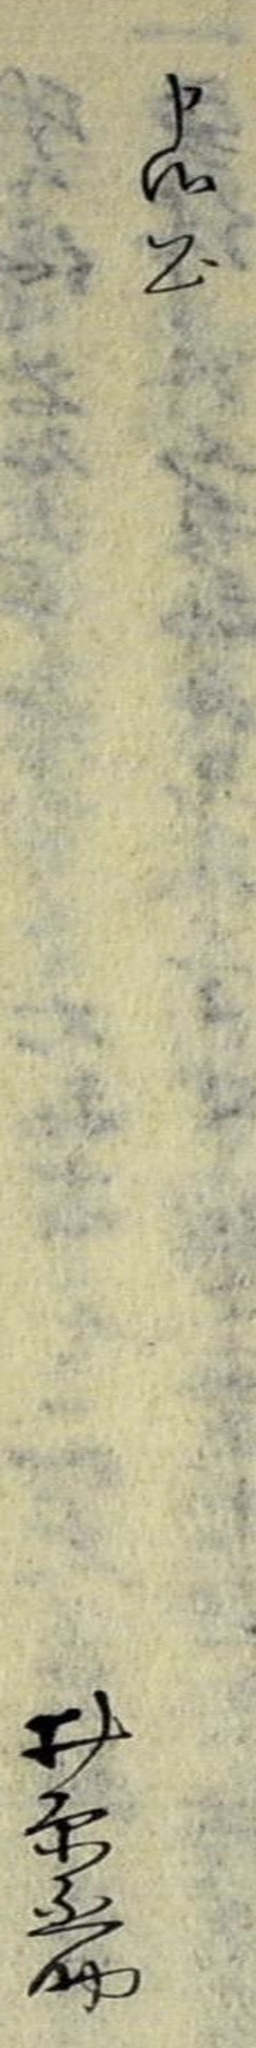井原丞助
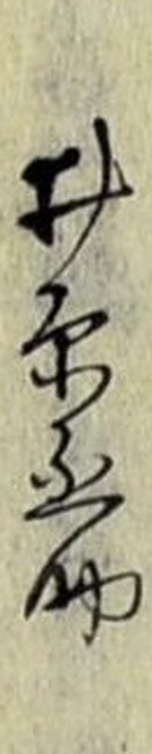井原丞助
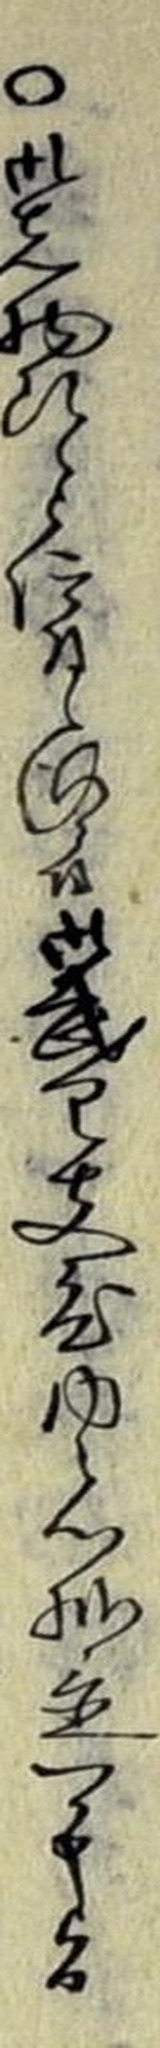〇御先物頭へ被仰付候趣ニ付御武具支度内々心掛置可申旨
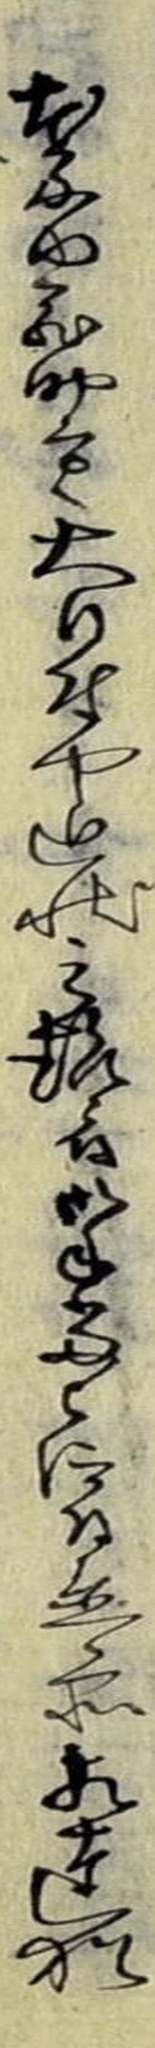本多内蔵助方へ大目付中廻状之趣ニ付御手当被仰付置候所相達猶
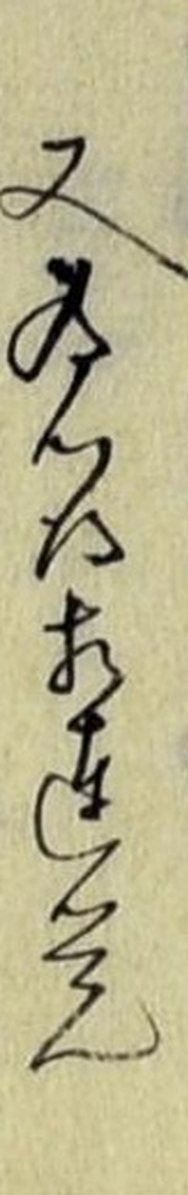又為心得相達覚
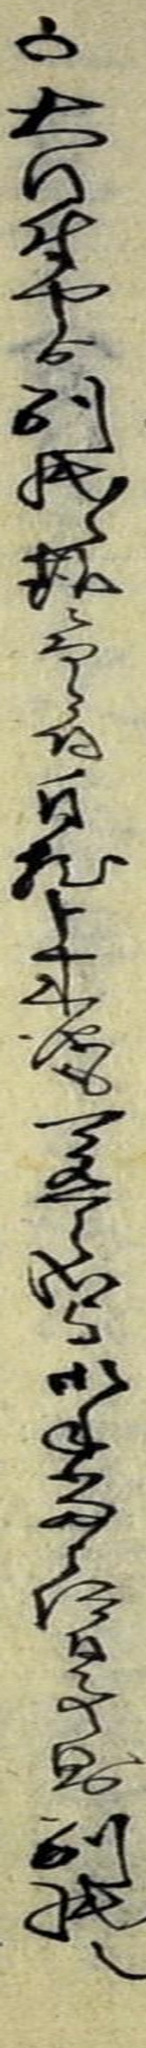〇大目付中ゟ別紙之趣ニ而候付自然申来儀も可有之哉与御手当被仰付事則別紙之
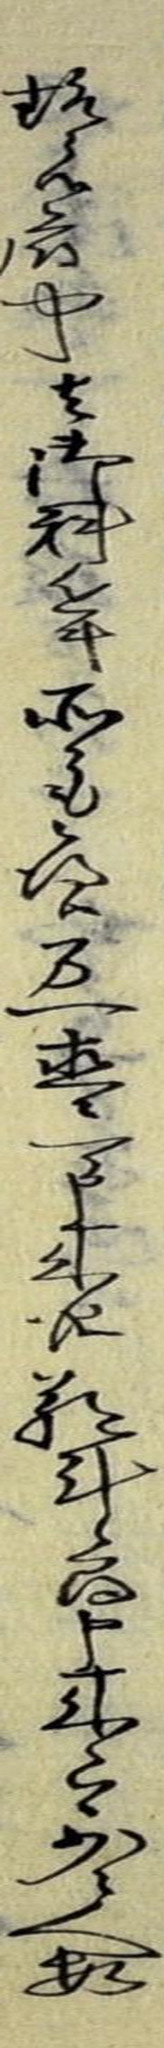趣ニ候府中者御料近キ所ニも候得ハ万一直々可申来儀難計候間申来候ハヽ少々人数
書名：命令之部 一
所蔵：福井県文書館 Fukui Prefectural Archives
